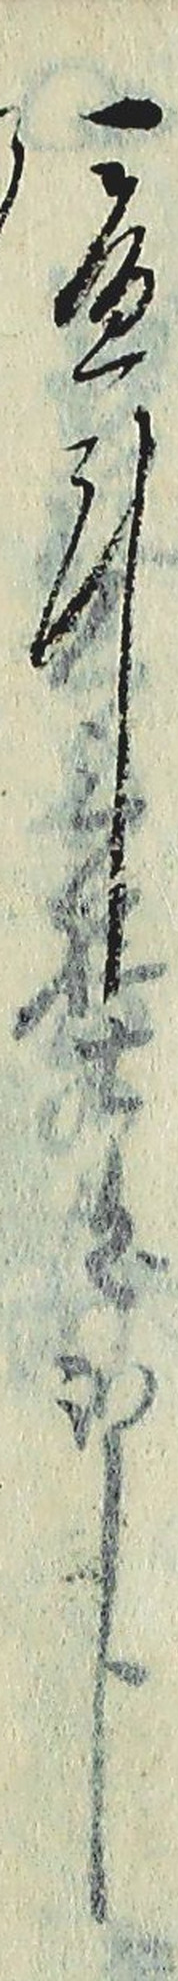一昼計
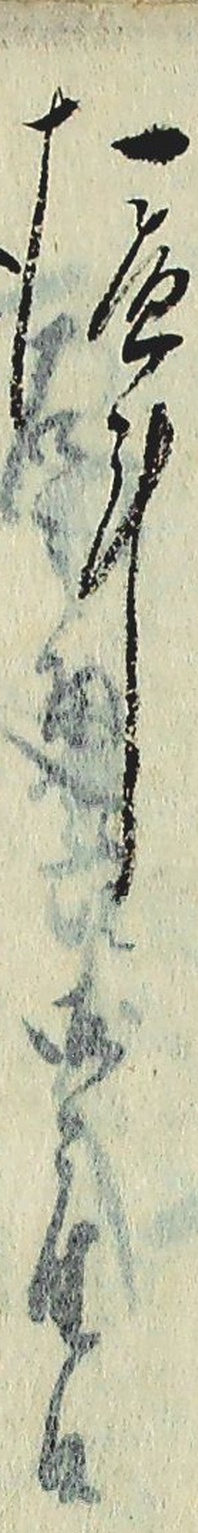一昼計
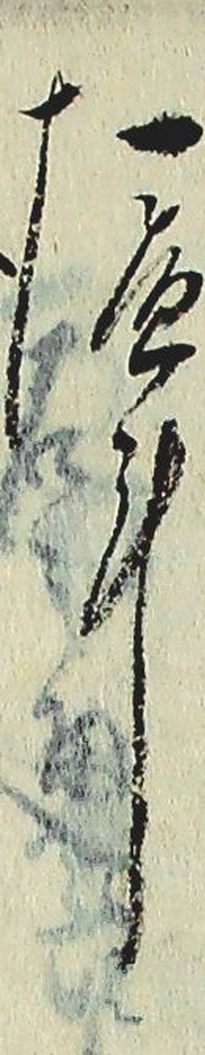一昼計
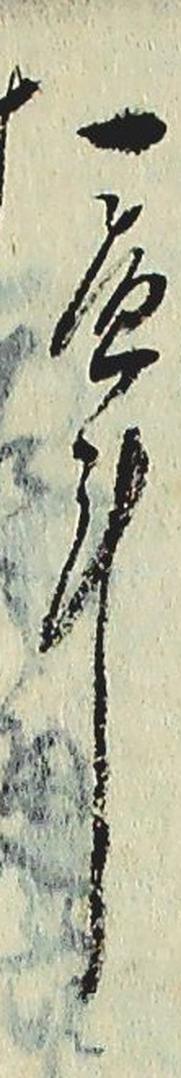一昼計
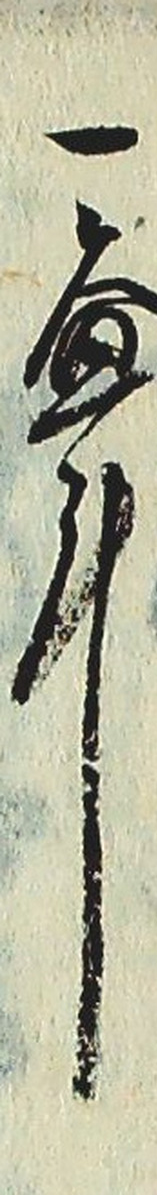一昼夜
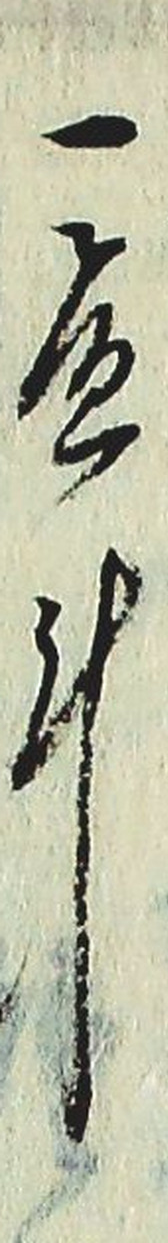一昼計
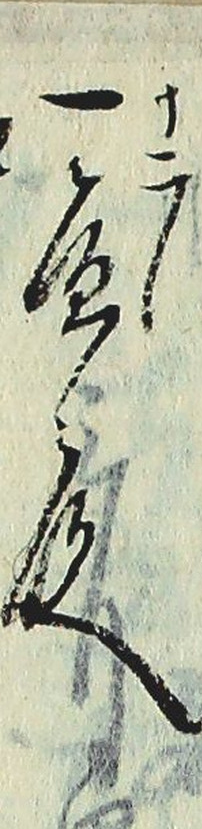一昼夜
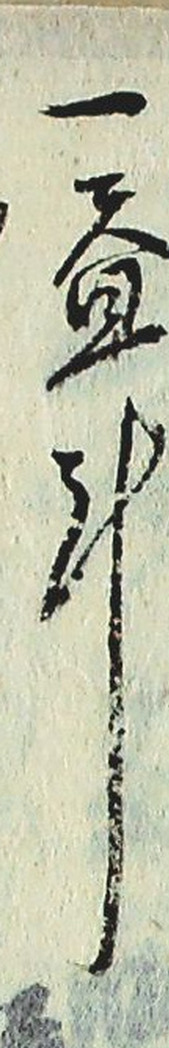一昼計
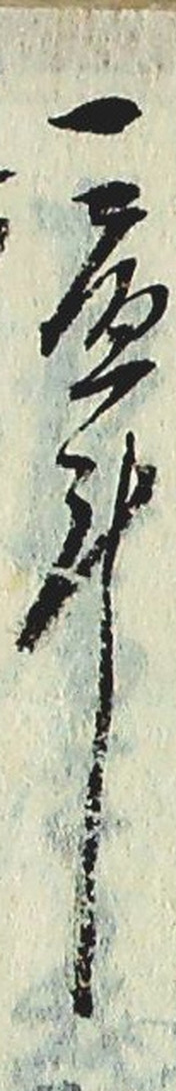一昼計
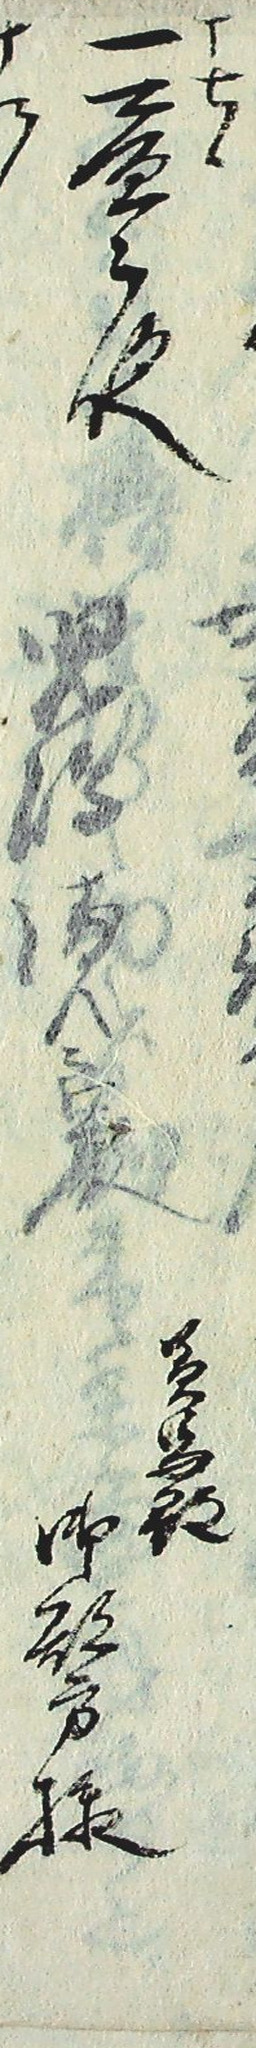一昼夜御郡方様
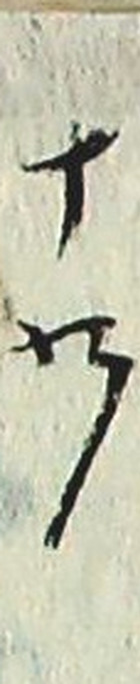十九日

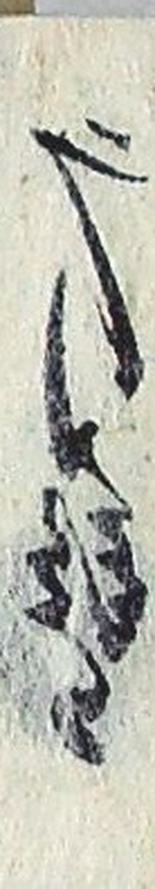廿一日
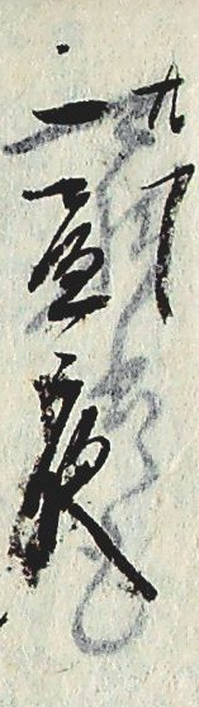一昼夜
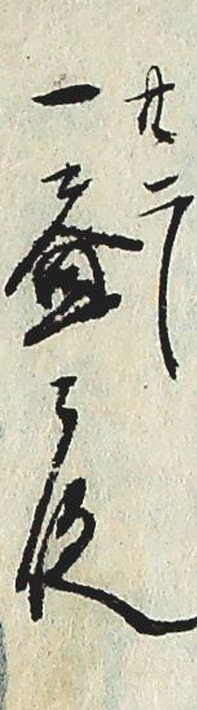一昼夜
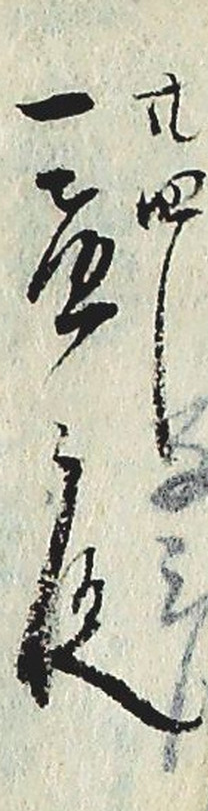一昼夜
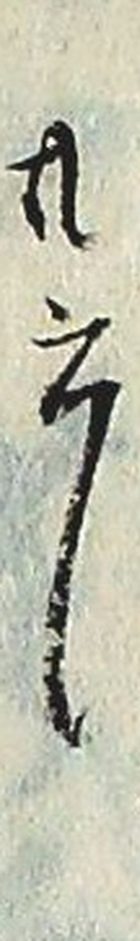廿六日
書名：名東郡中諸割賦元帳
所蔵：鳴門教育大学 Naruto University of Education
